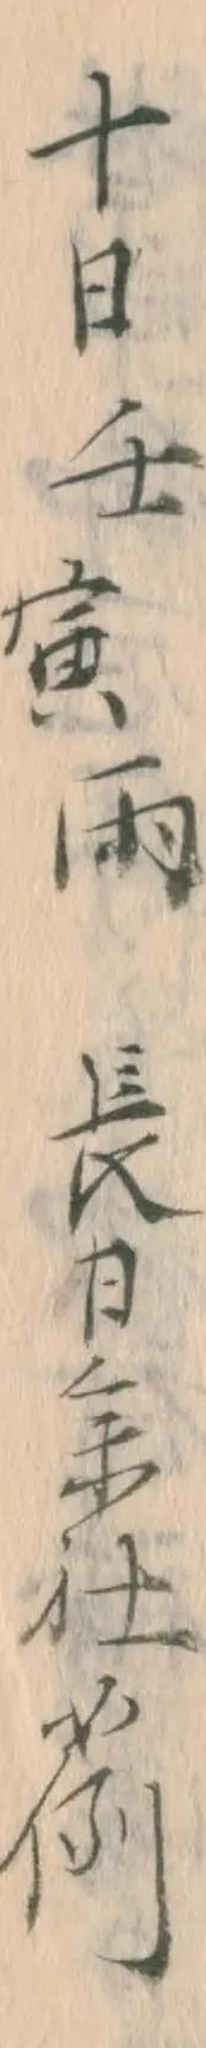十日壬寅雨長日参社如例
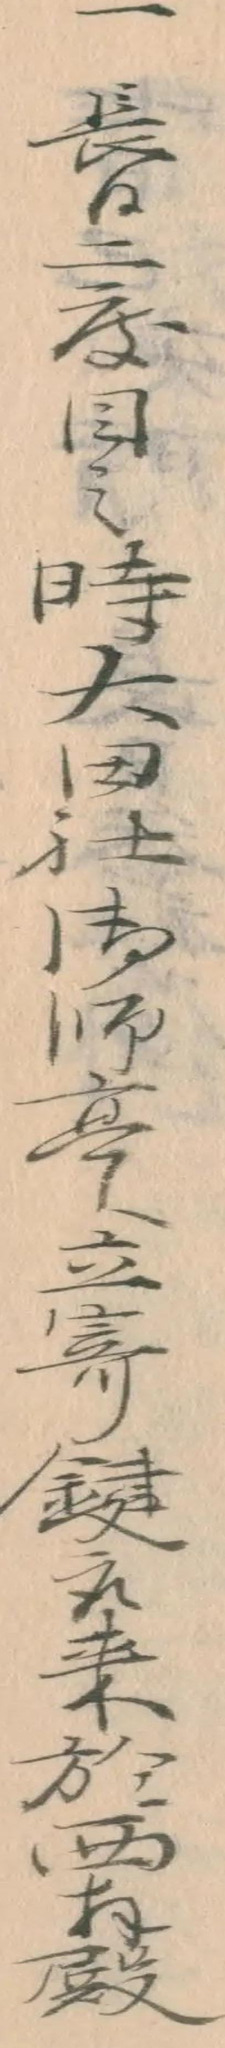一長日二度目之時大田社御師亭へ立寄鍵取来於西相殿
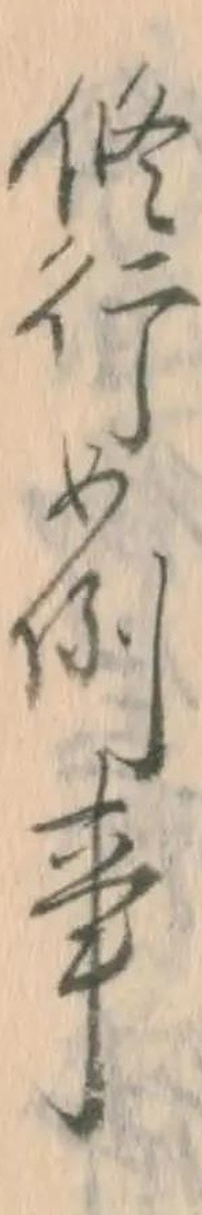修行如例事
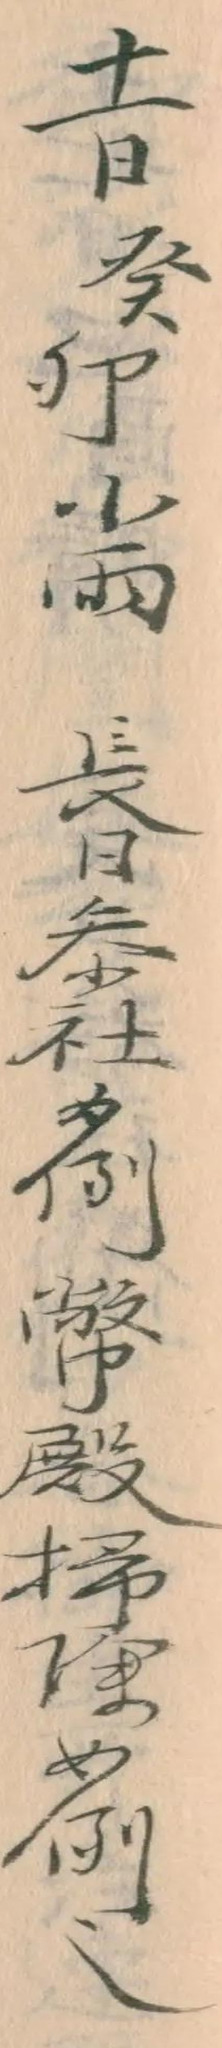十一日癸卯小雨長日参社如例幣殿掃除如例也
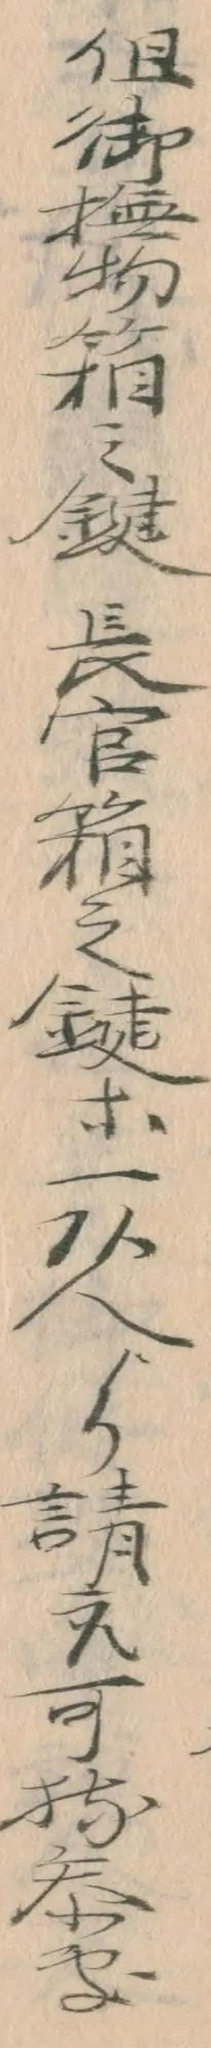但御撫物箱之鍵長官箱之鍵等一頭人より請取可持参處
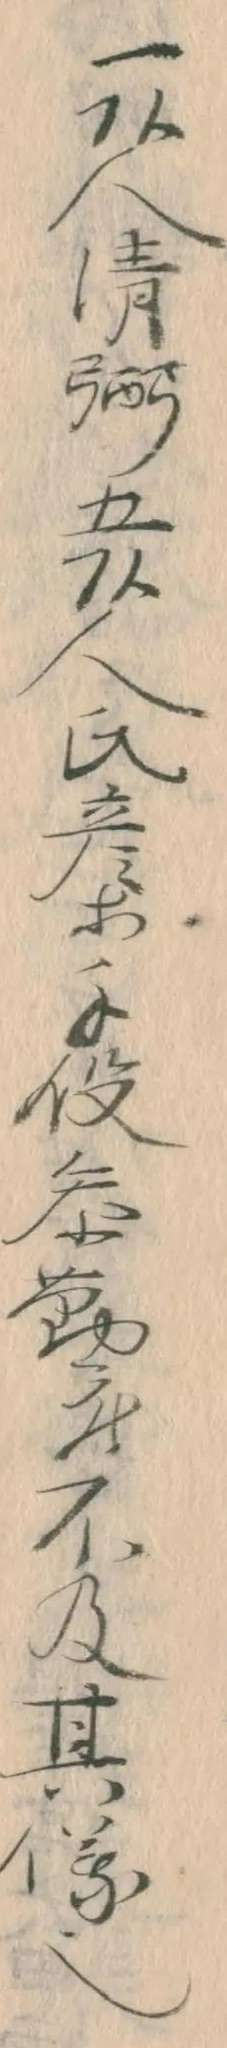一頭人清弼五頭人氏彦等手役参勤ニ付不及其儀也
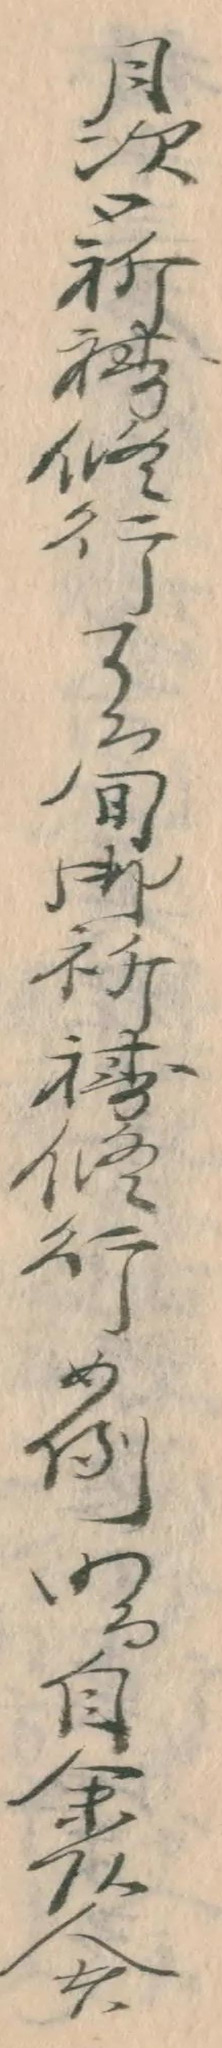一月次御祈祷修行了而旬御祈禱修行如例仍而自余頭人参
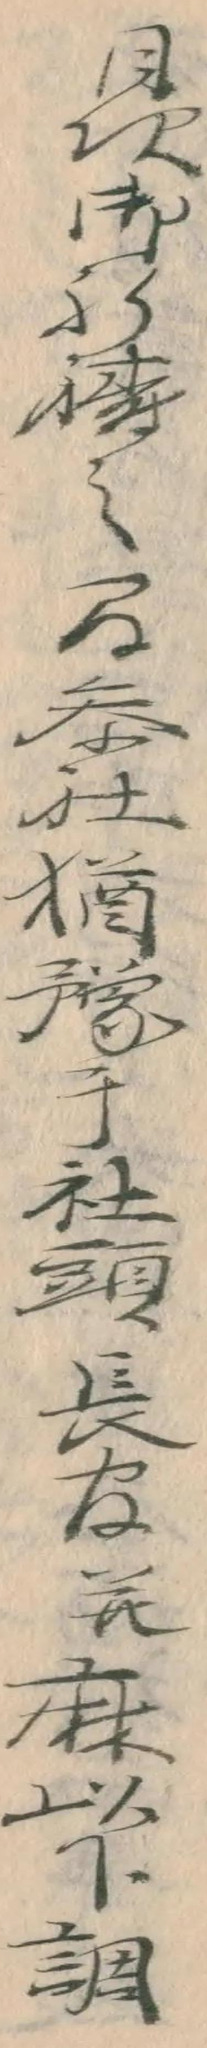月次御祈祷之間参社猶豫于社頭長官并麻以下調
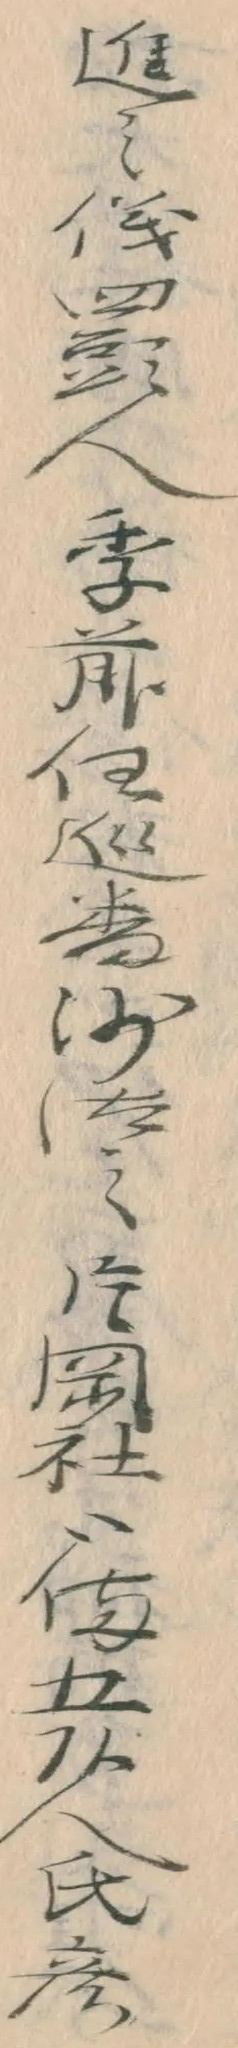進之儀四頭人季前任巡番沙汰之片岡社御備五頭人氏彦
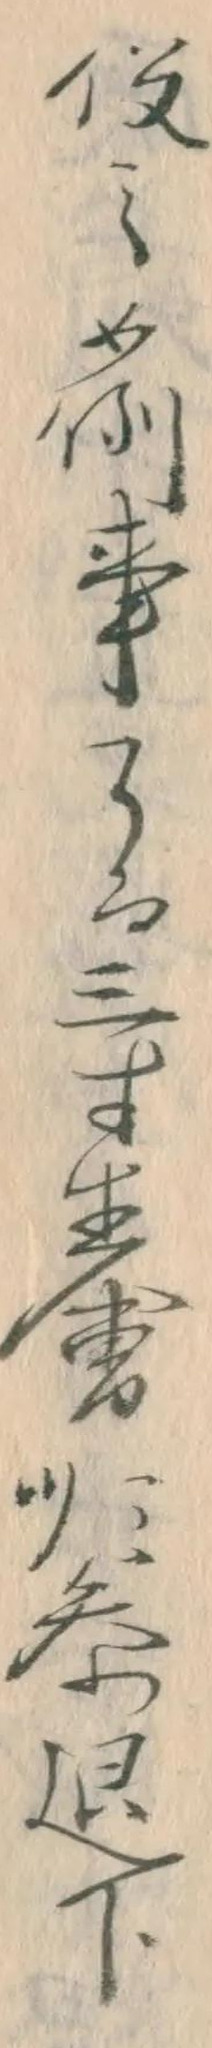役之如例事了而三寸直會順参退下
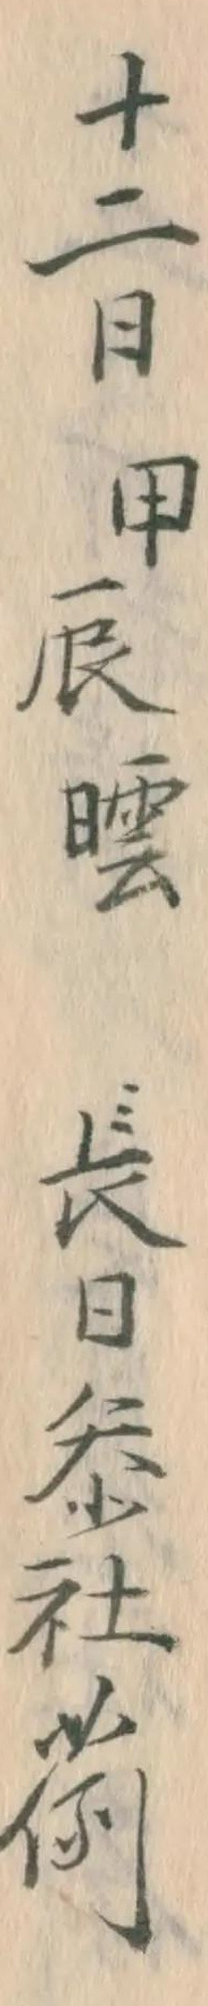十二日甲辰曇長日参社如例
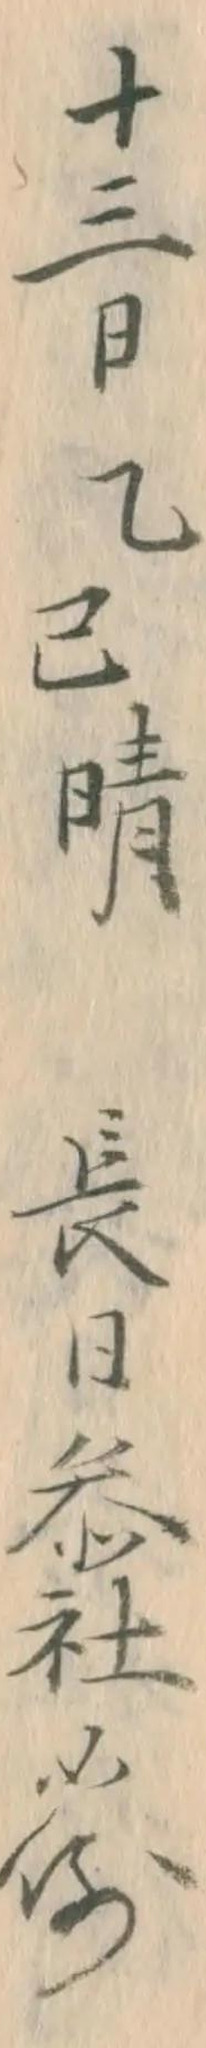十三日乙巳晴長日参社如例

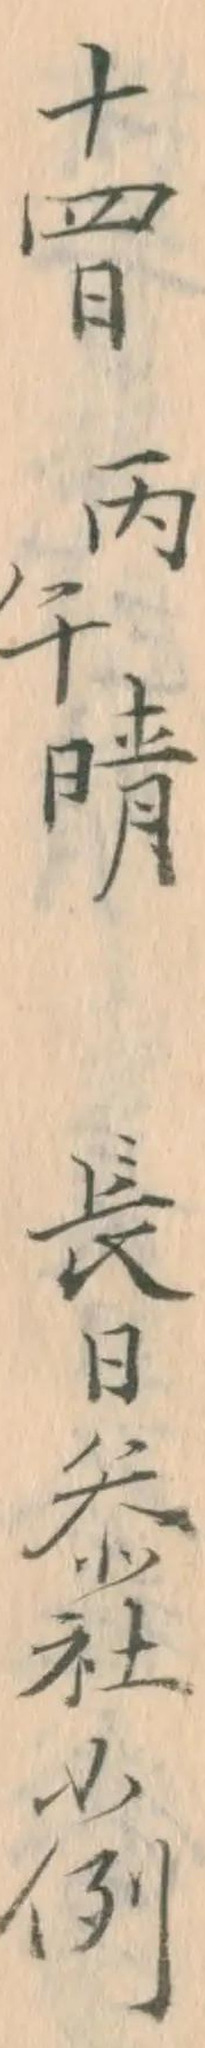十四日丙午晴長日参社如例
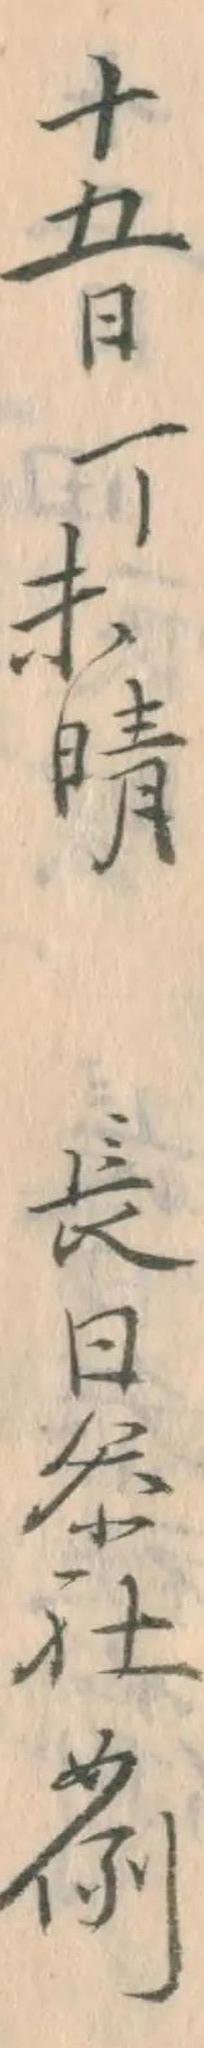十五日丁未晴長日参社如例
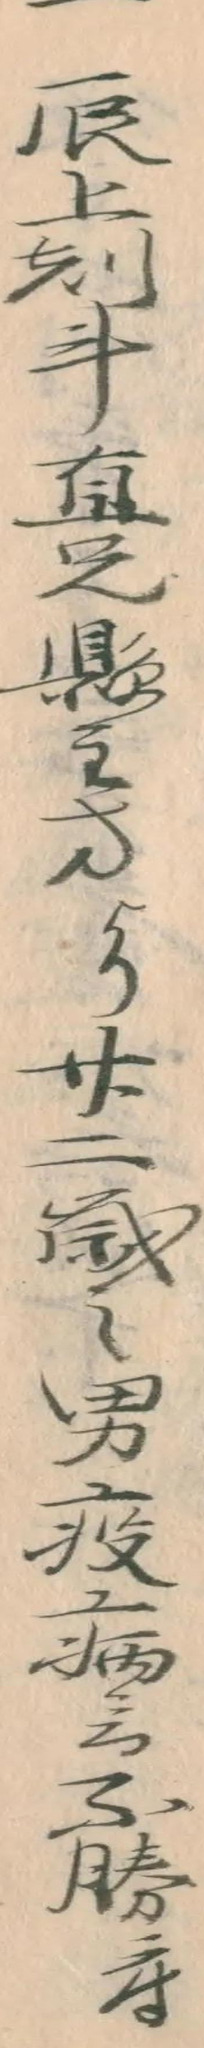一辰上刻斗直兄縣主方より廿二歳之男疫病ニ而不勝ニ付
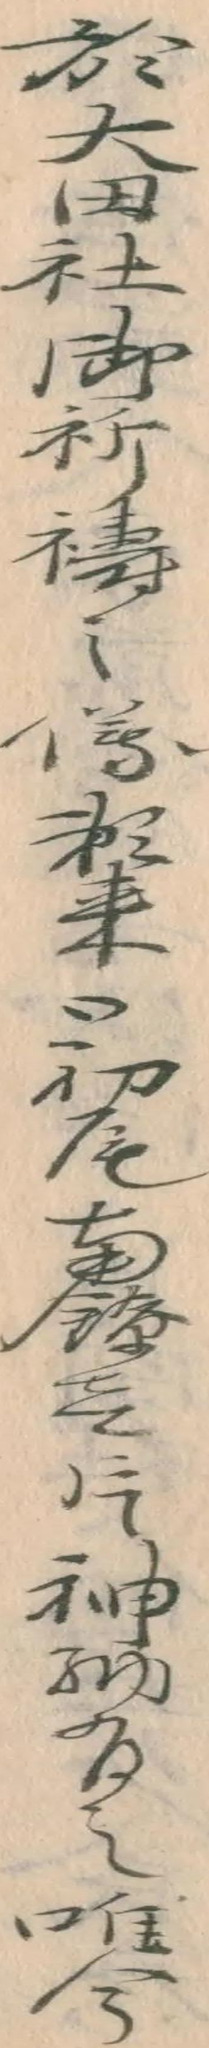於大田社御祈祷之儀頼来御初尾南鐐壱片神納有之唯今
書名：賀茂社記録. 第73冊
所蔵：国立国会図書館 National Diet Library, JAPAN
